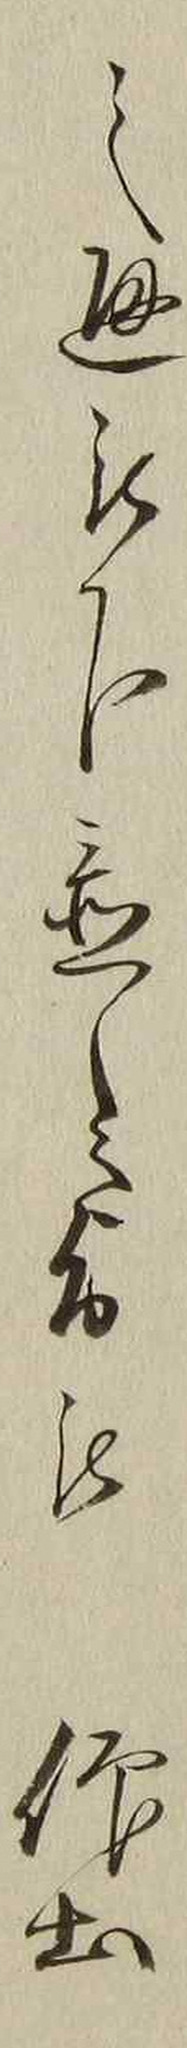之通被下置之旨被仰出
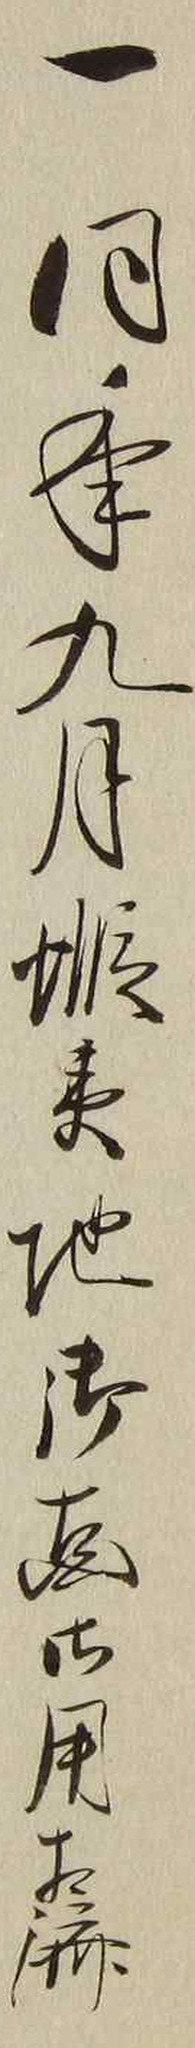一同年九月蝦夷地御固御用相済
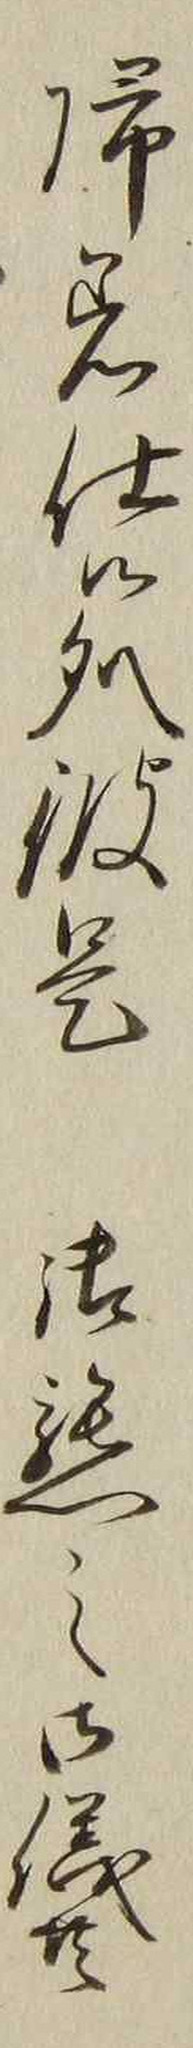帰着仕候処彼是御懇之御儀共
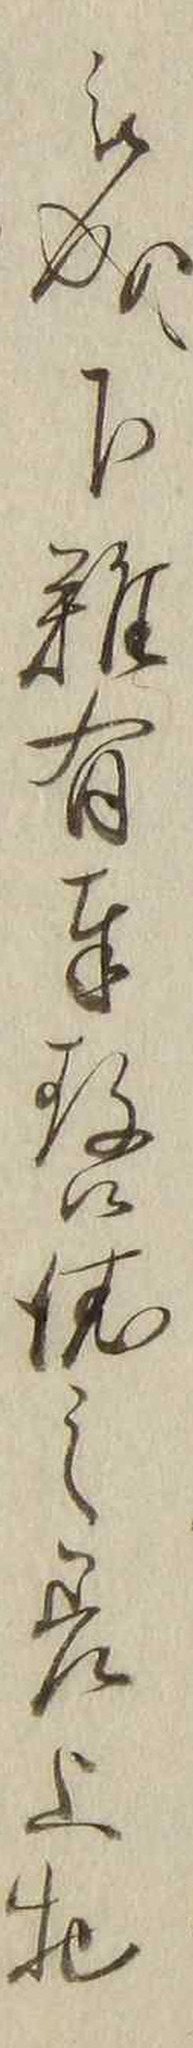被成下難有奉存候依之差上物
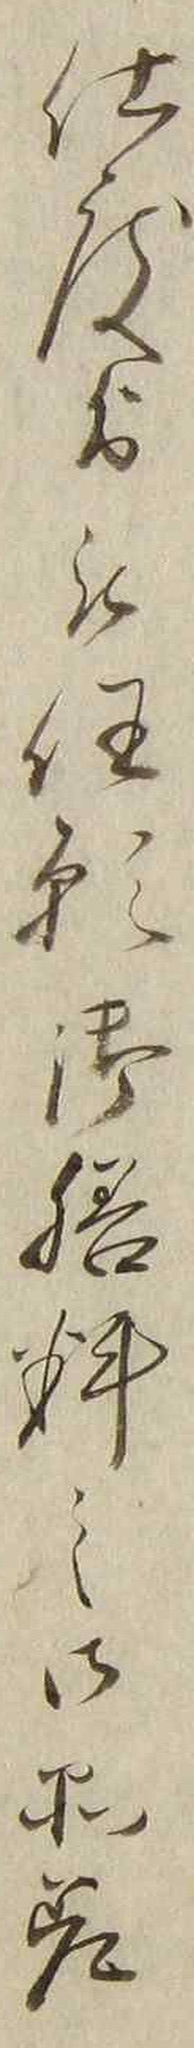仕度旨被任願御膳料之御品差

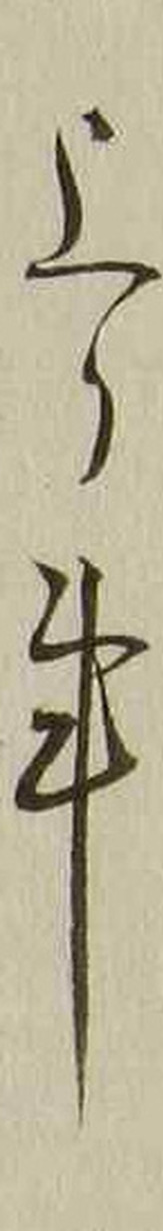上候事
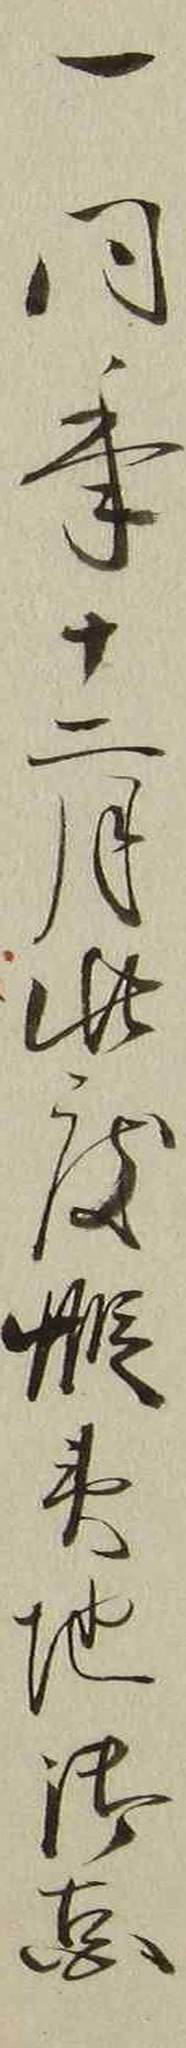一同年十二月此度蝦夷地御固
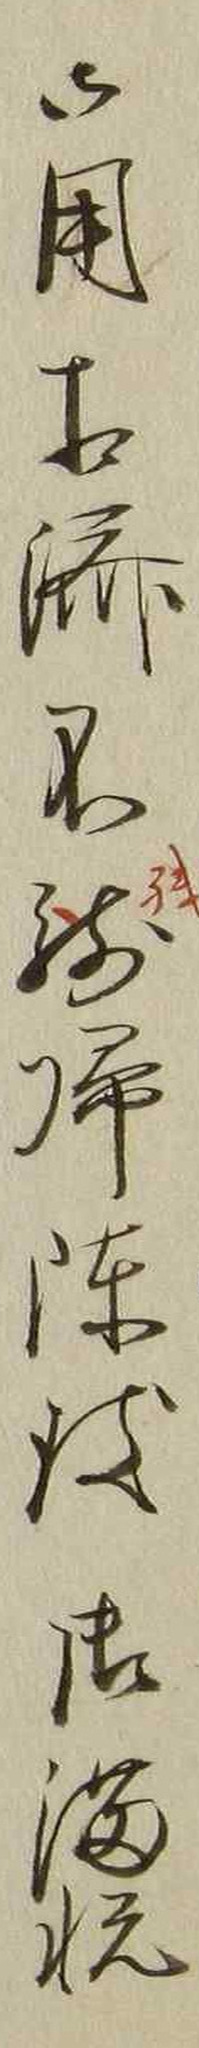御用相済不残帰陣致御満悦
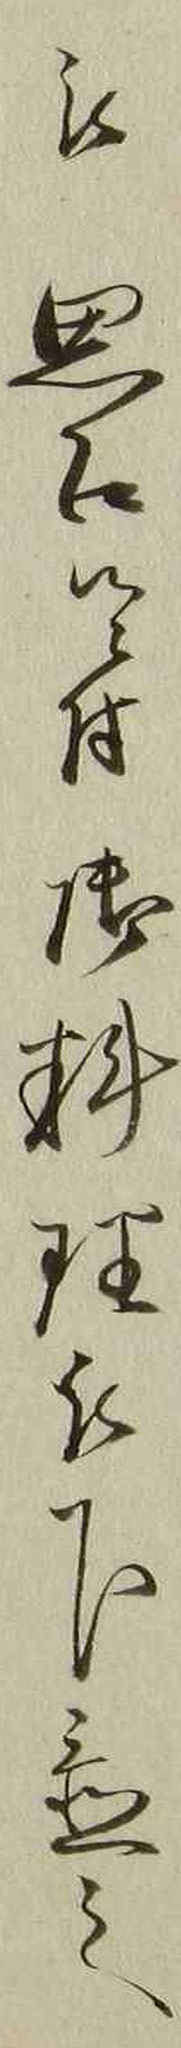被思召候に付御料理被下置之
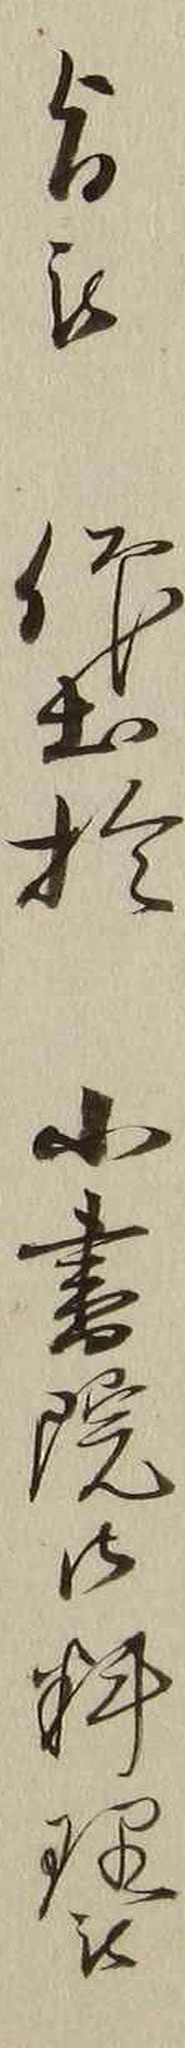旨被仰出於小書院御料理被
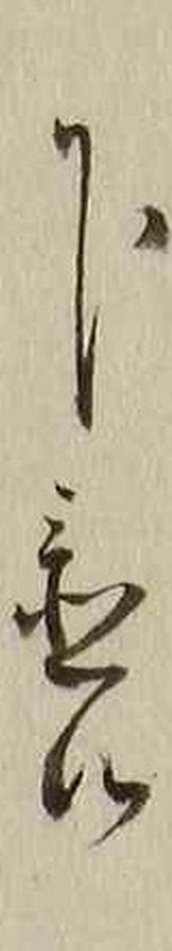下置候
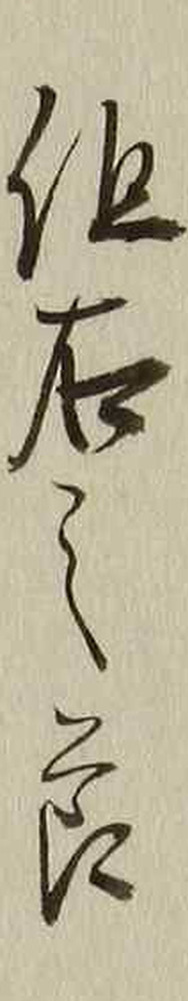但右之節
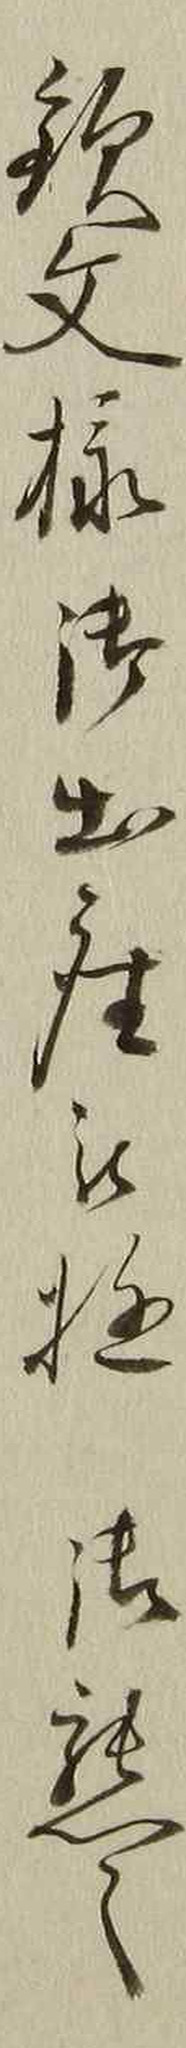欽文様御出座被遊御懇之
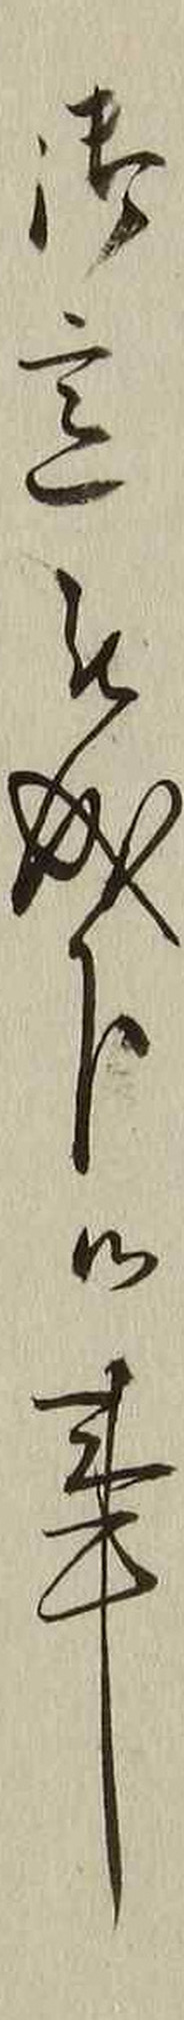御意被成下候事
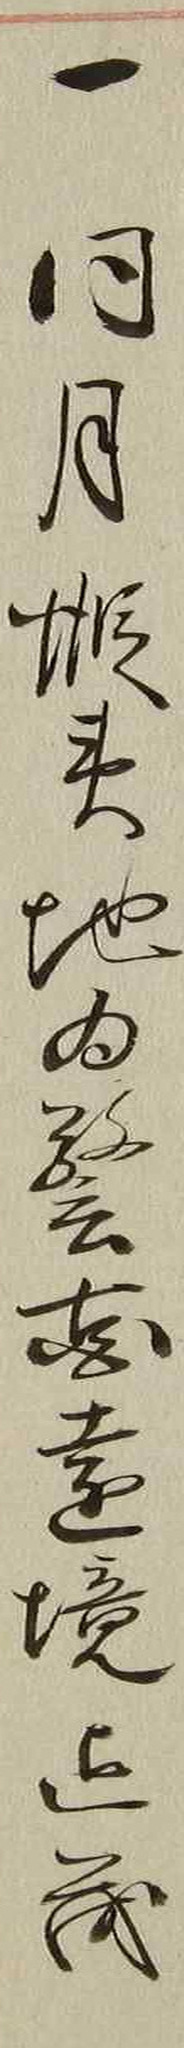一同月蝦夷地為警固遠境迄も
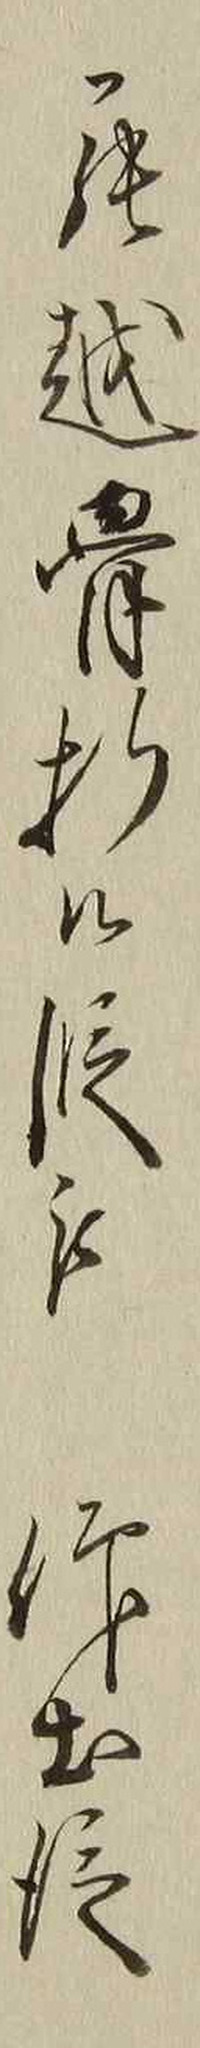罷越骨折侯段被仰出従
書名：諸士系譜　巻之103　か之部11
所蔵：会津若松市立会津図書館
